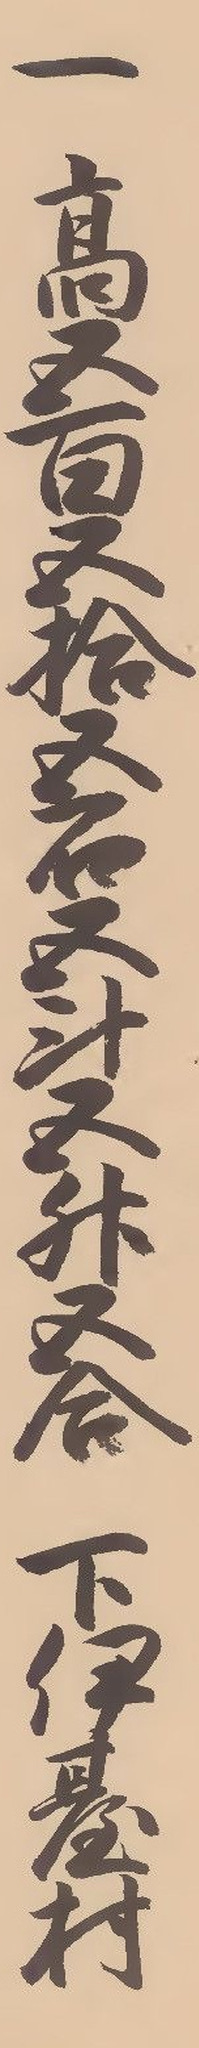一高五百五拾五石五斗五升五合下伊台村
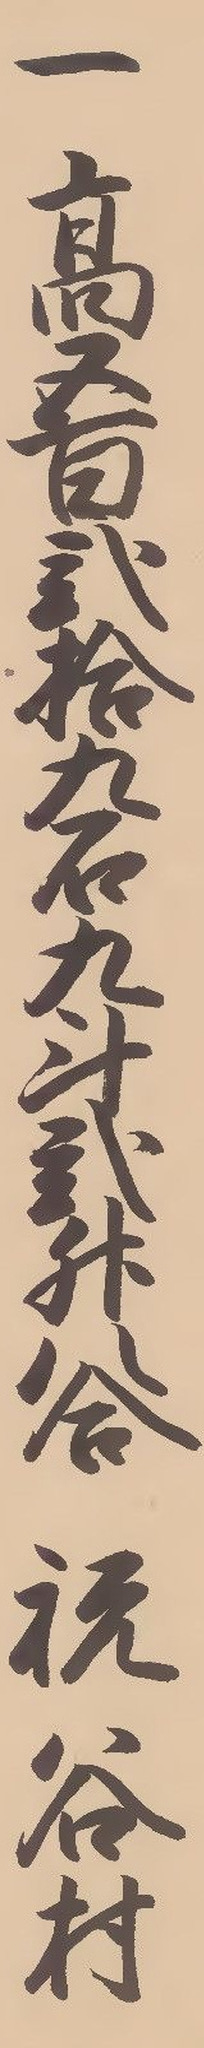一高五百弐拾九石九斗弐升八合祝谷村
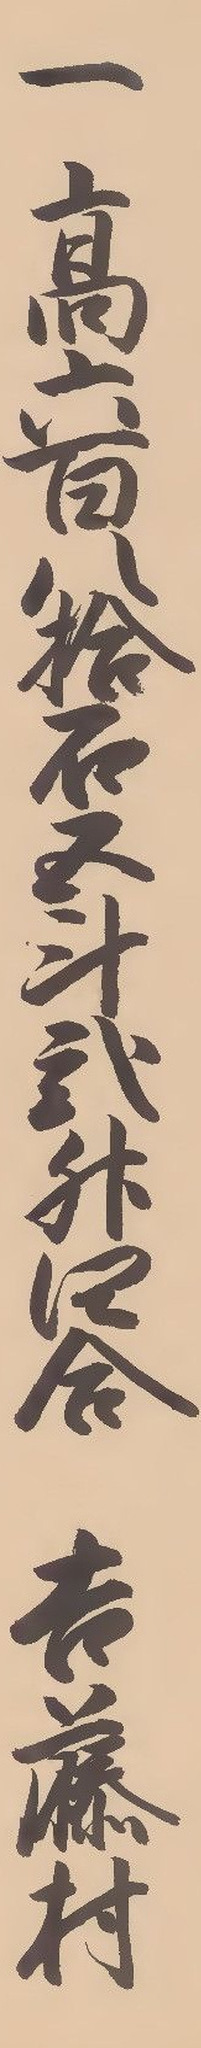一高六百八拾石五斗弐升四合吉藤村
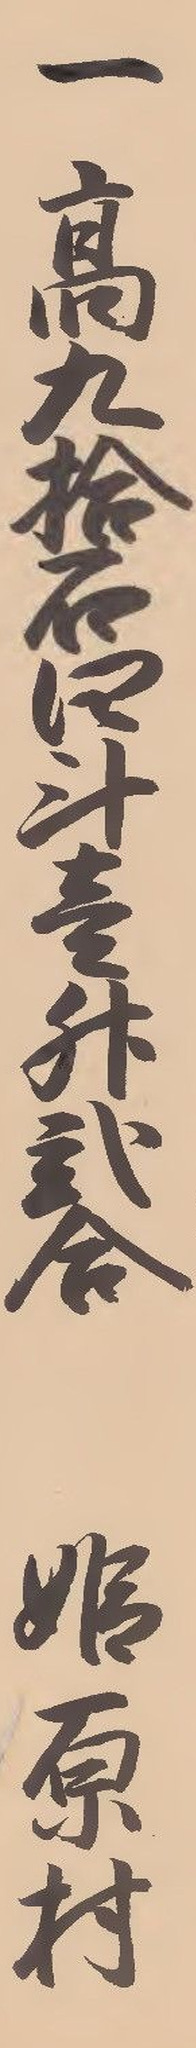一高九拾石四斗壱升弐合姫原村
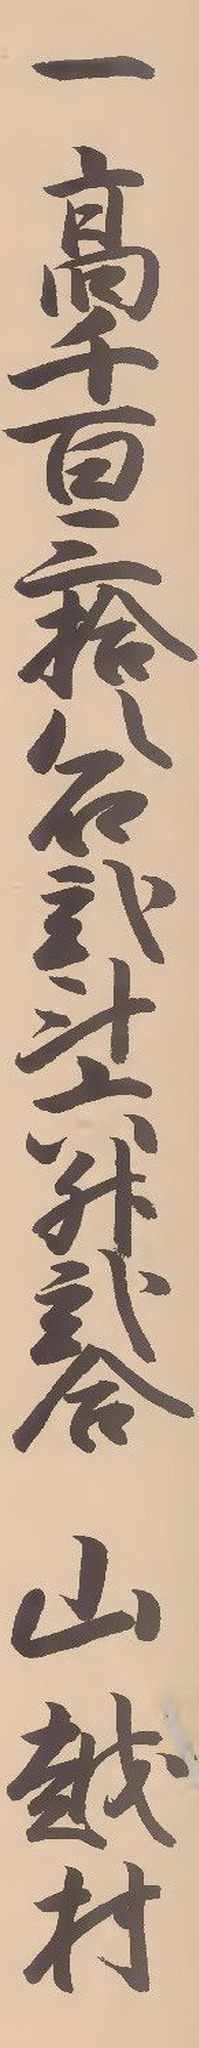一高千百三拾八石弐斗六升弐合山越村
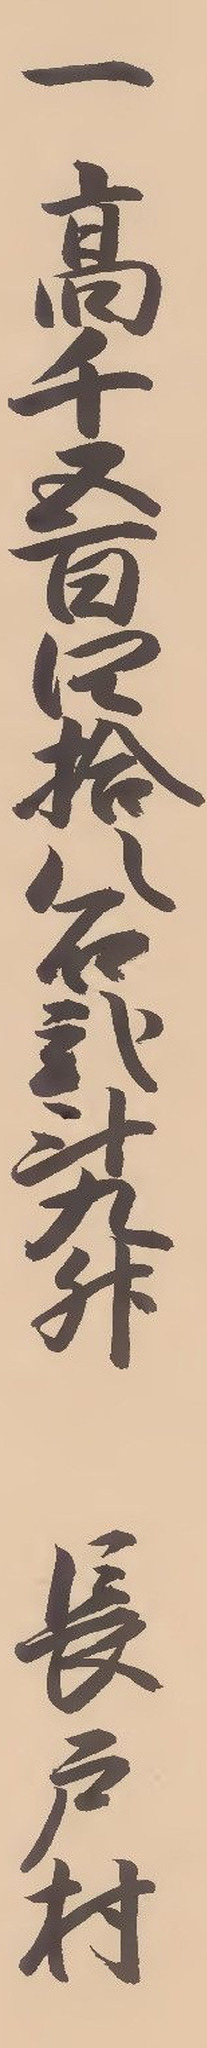一高千五百四拾八石弐斗九升長戸村
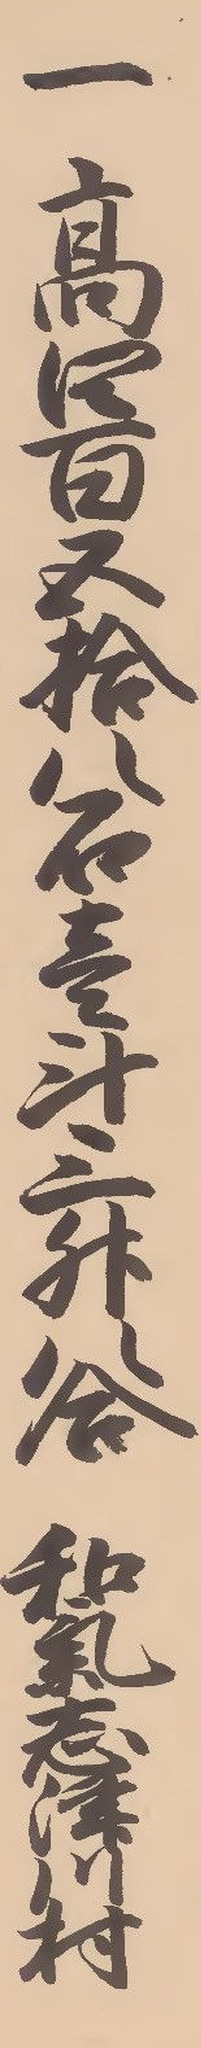一高四百五拾八石壱斗三升八合和気志津川村
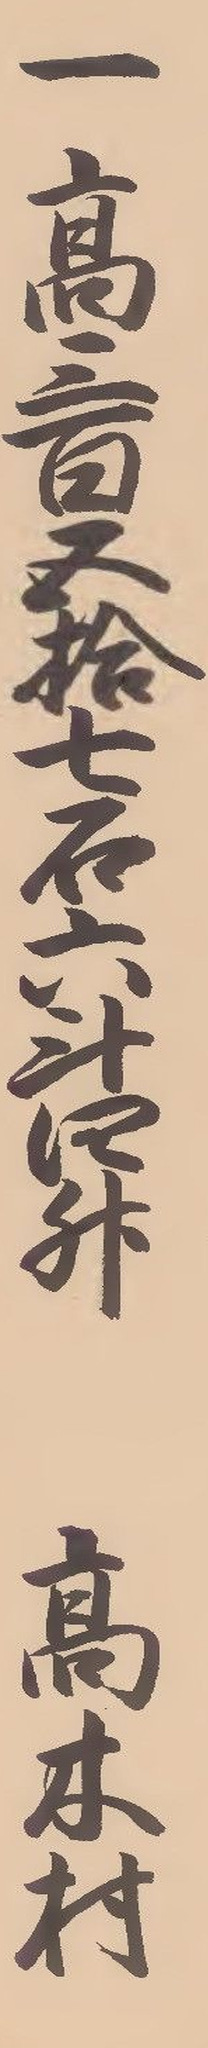一高三百五拾七石六斗四升高木村

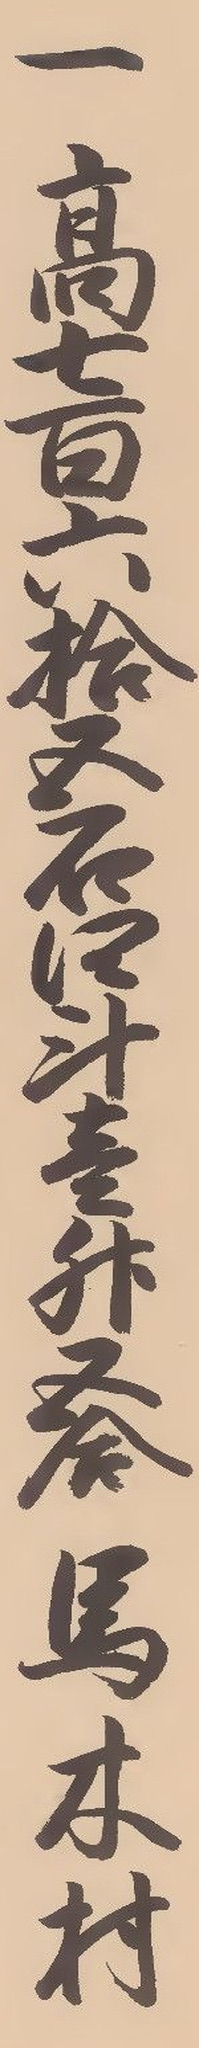一高七百六拾五石四斗壱升五合馬木村
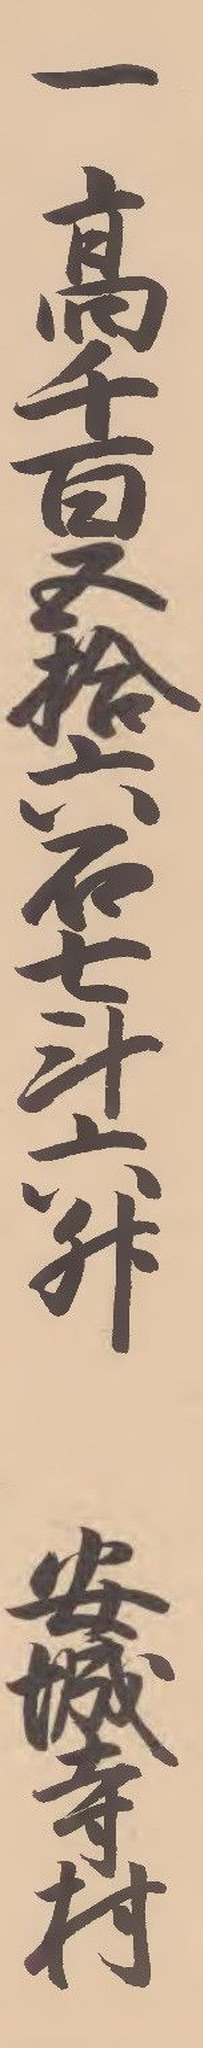一高千百五拾六石七斗六升安城寺村
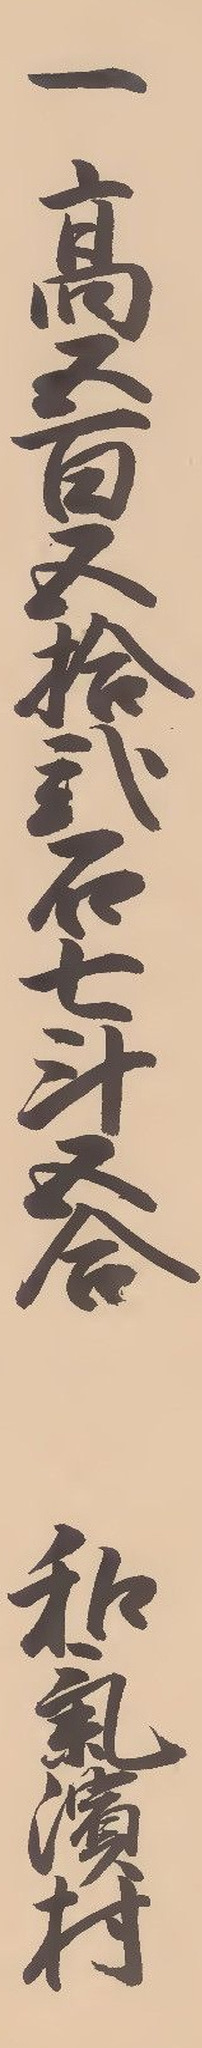一高五百五拾弐石七斗五合和気浜村
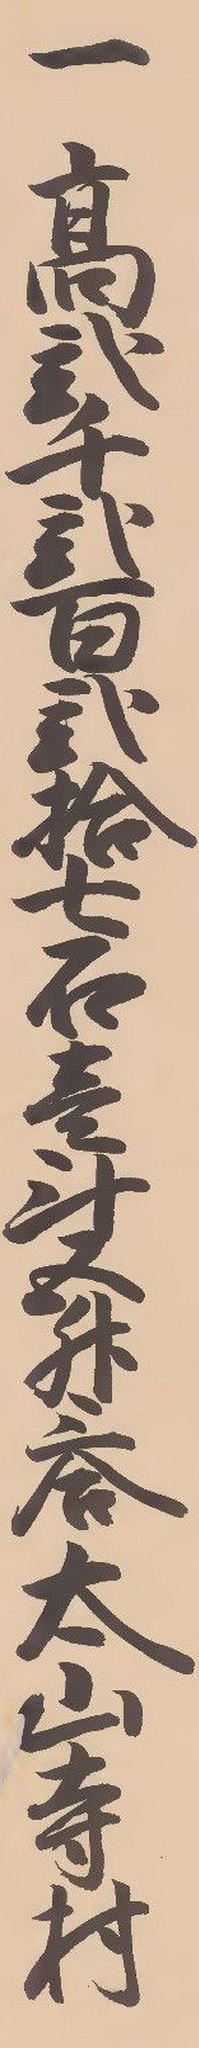一高弐千弐百弐拾七石壱斗五升三合太山寺村
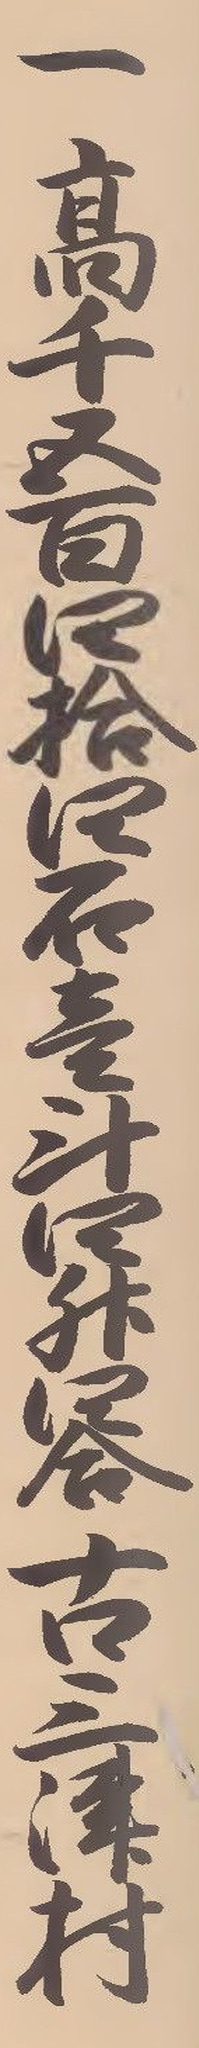一高千五百四拾四石壱斗四升四合古三津村
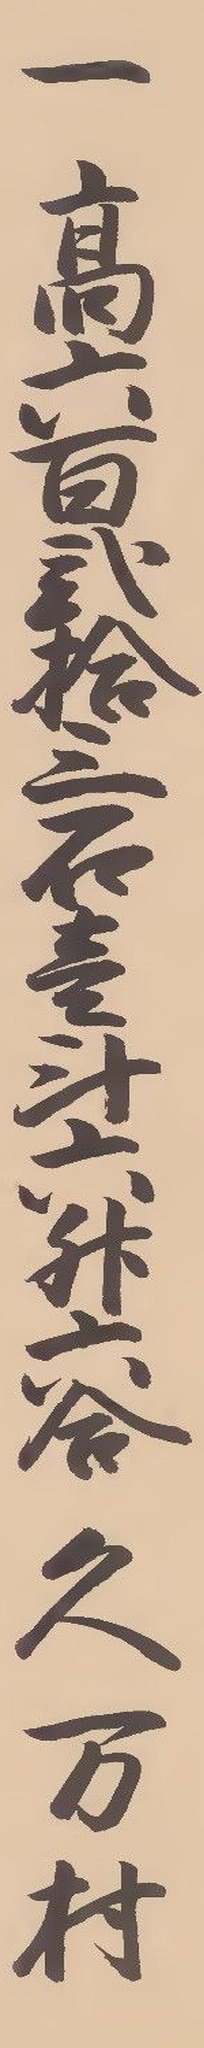一高六百弐拾三石壱斗六升六合久万村
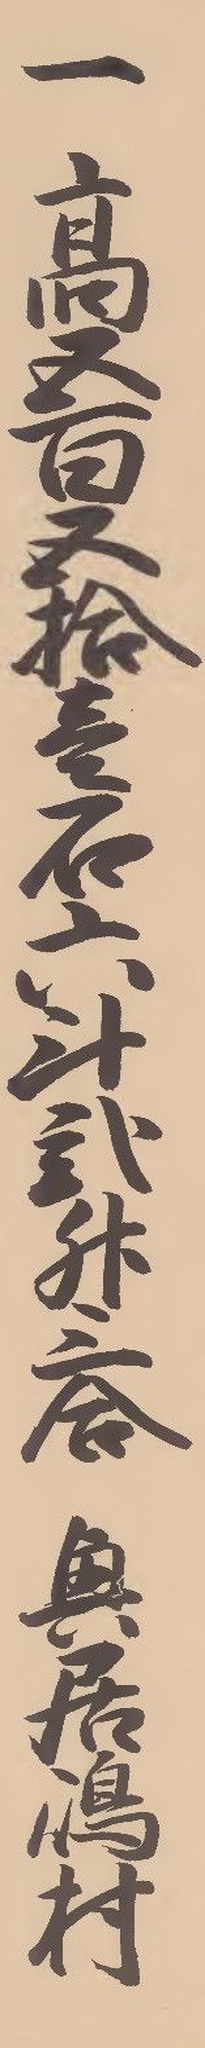一高五百五拾壱石六斗弐升三合興居島村
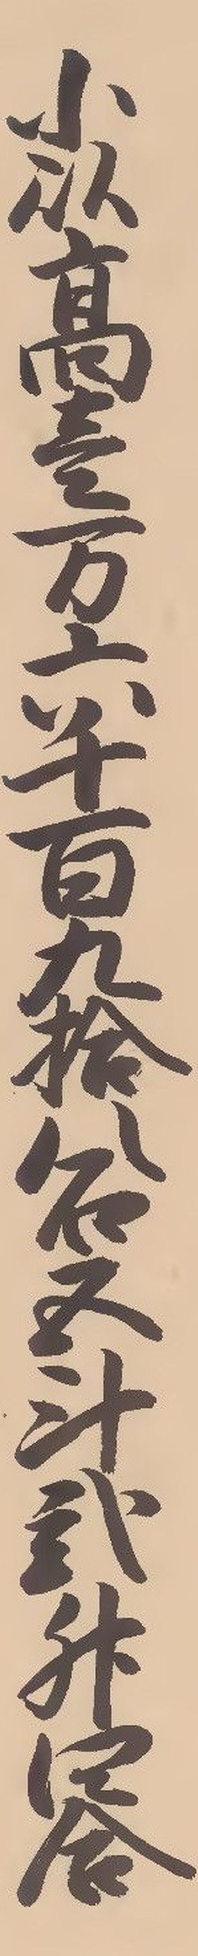小以高壱万六千百九拾八石五斗弐升四合
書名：伊予国郷帳
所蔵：国立公文書館 National Archives of Japan
